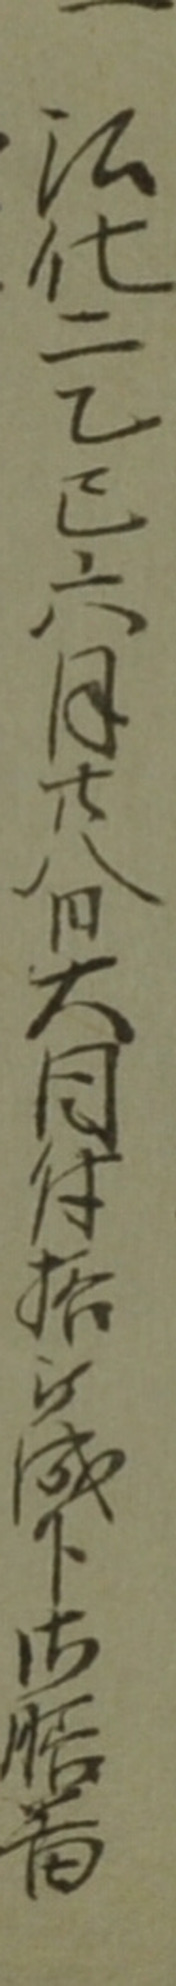一弘化二乙巳六月廿八日大目付格被成下御膳番
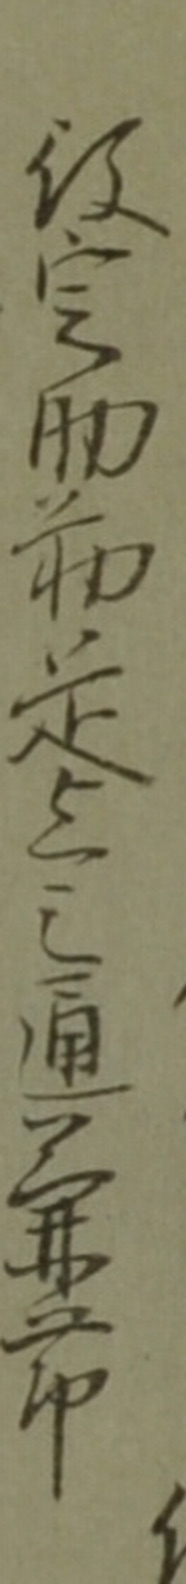役定助勤是迄之通兼帯
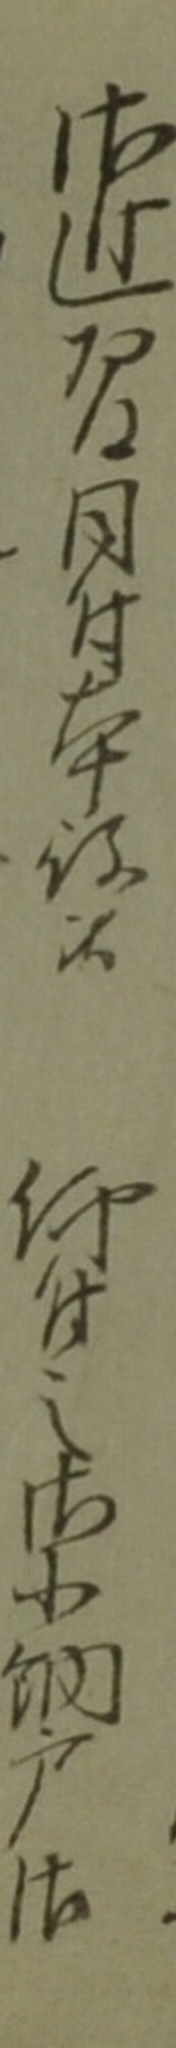御近習目付本役被仰付之御小納戸
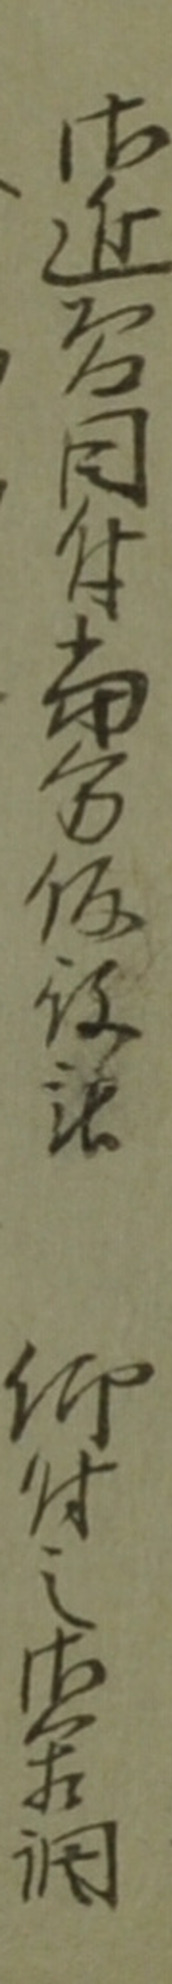御近習目付当分仮役被仰付之御箱調
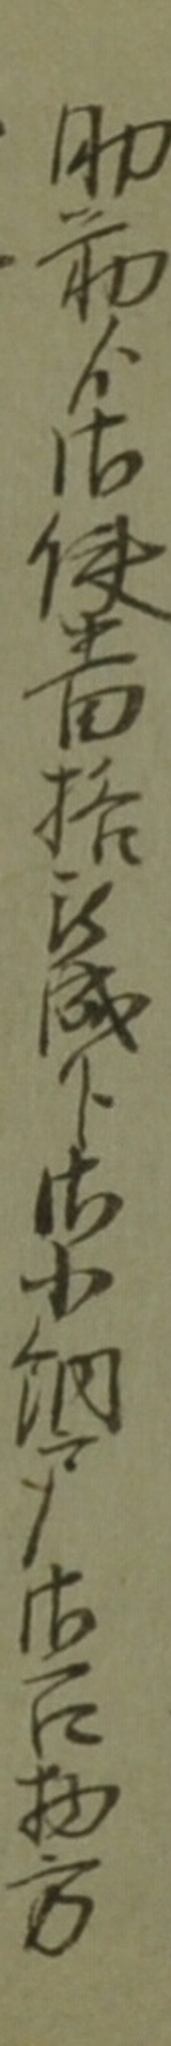助勤ゟ御使番格被成下御小納戸御召物方
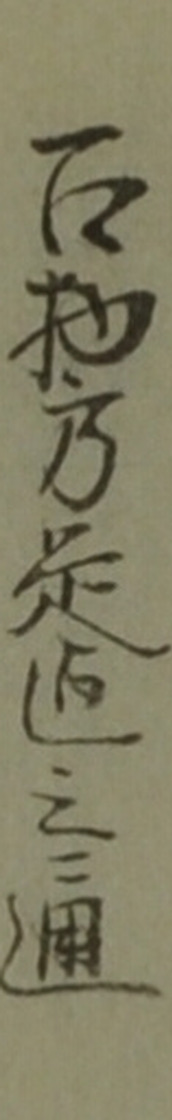召物方是迄之通

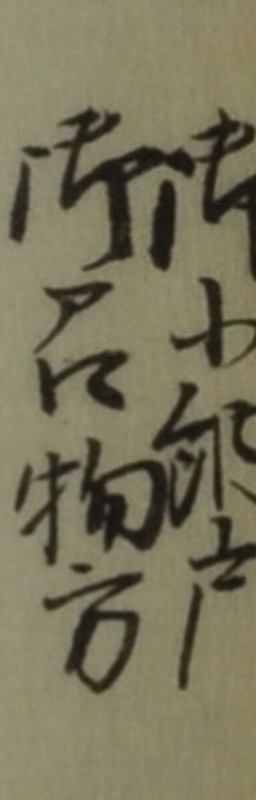御召物方
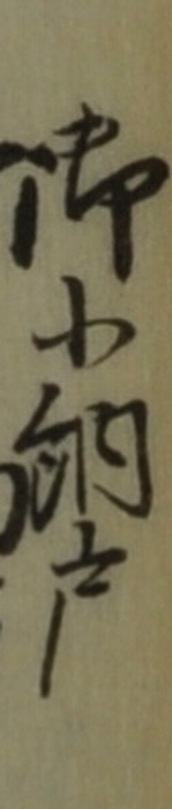御小納戸
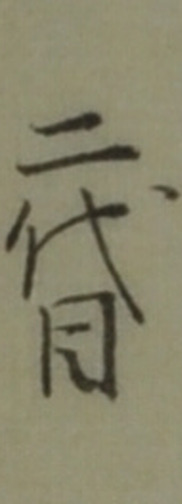二代目
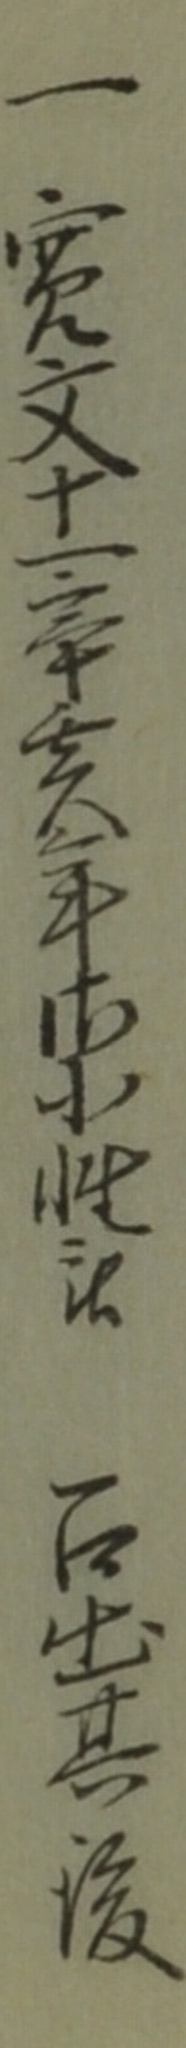一貫文十一辛亥年御小野被召出其後
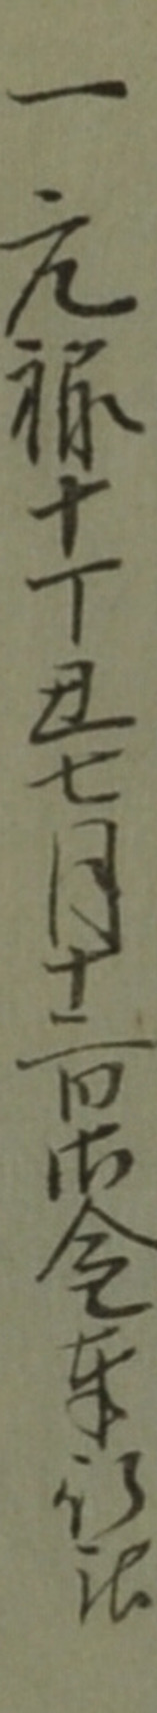一元禄十丁丑七月十二日御金奉行被
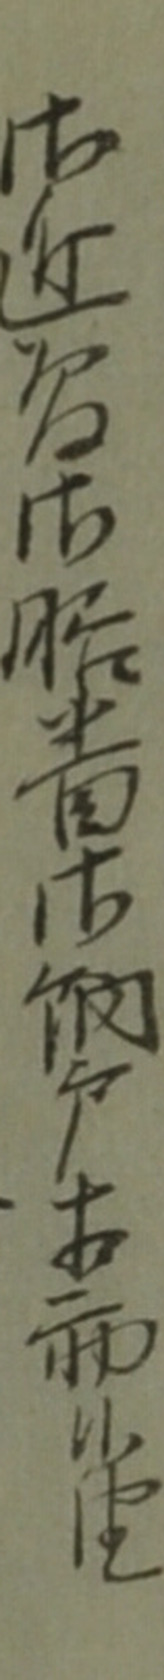御近習御膳番御納戸相勤国由
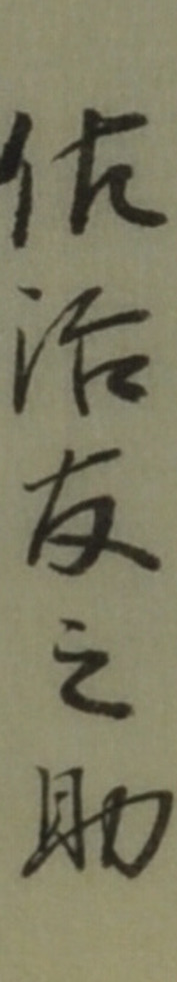佐治友之助
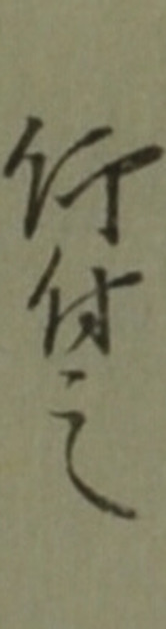仰付之
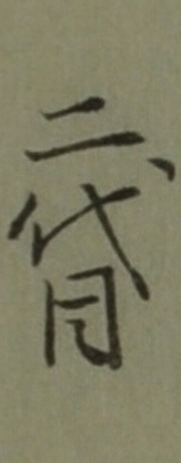二代目
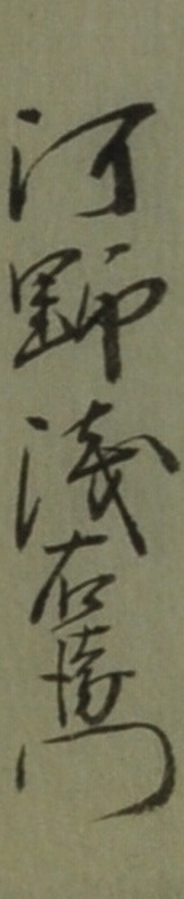河野浅右衛門
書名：諸御役代々録（四）
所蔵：伊那市立高遠町図書館・合同会社AMANE
